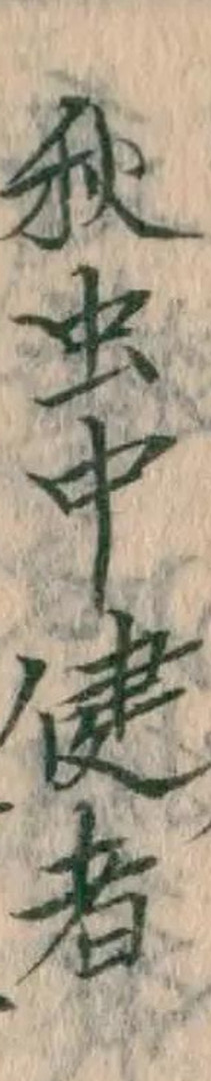秋虫中健者
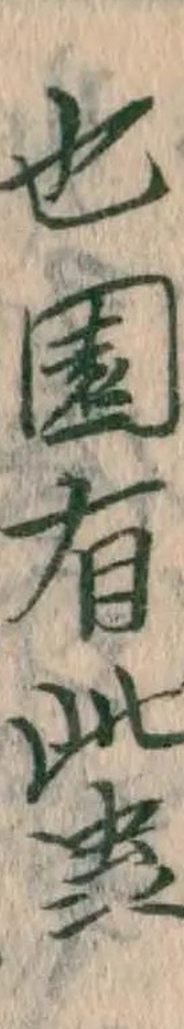也園有此蟲
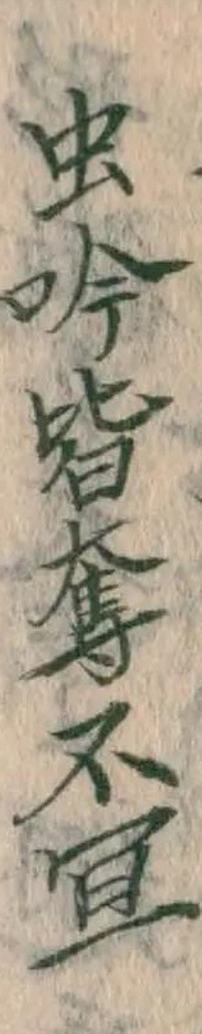虫吟皆奪不宜
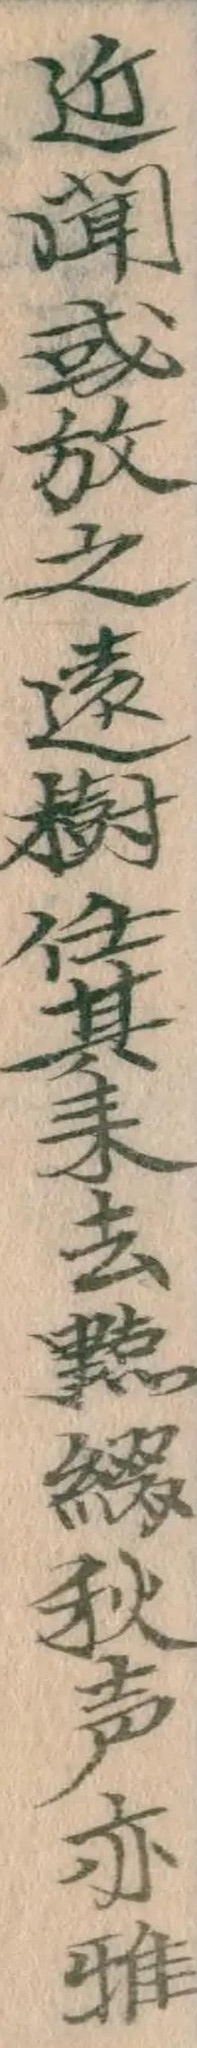近聞或放之遠樹任其来去點綴秋声亦雅
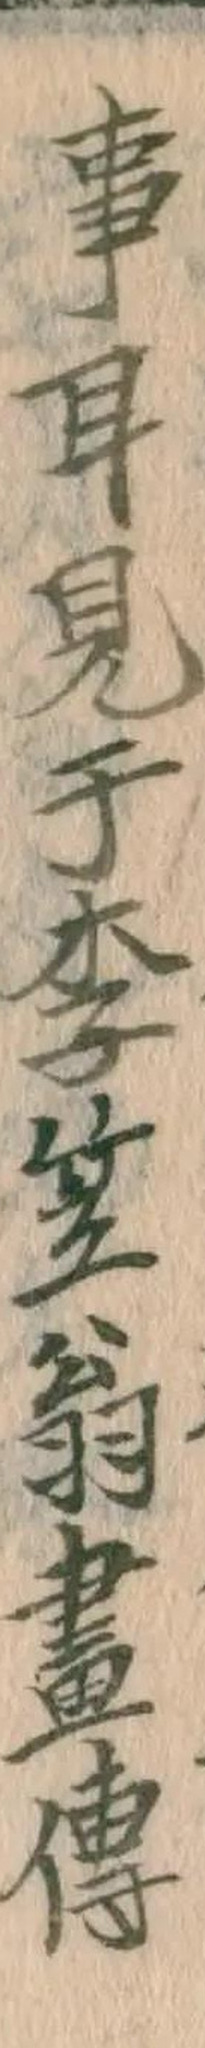事耳見于李笠翁画傳
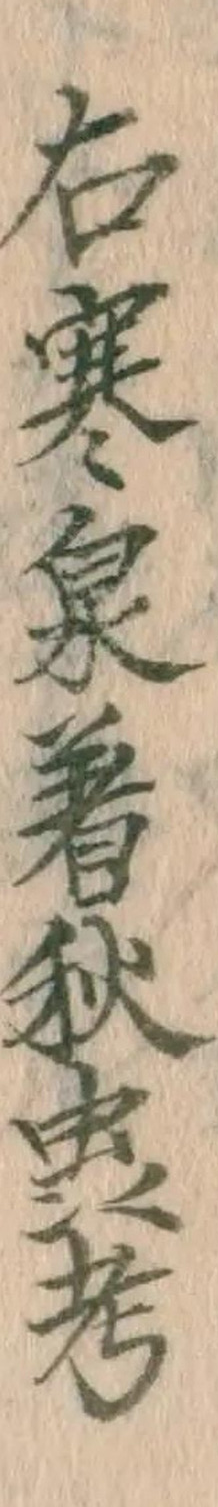右寒泉着秋虫考
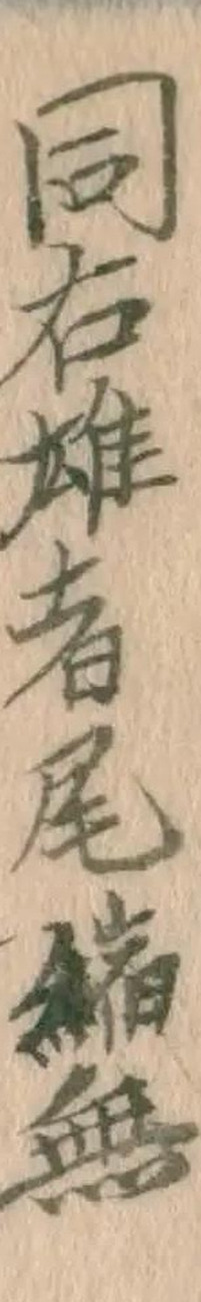同右雄者尾縮無
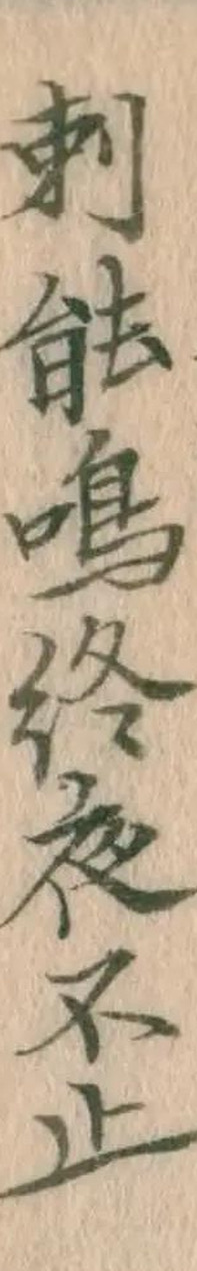刺能鳴終夜不止
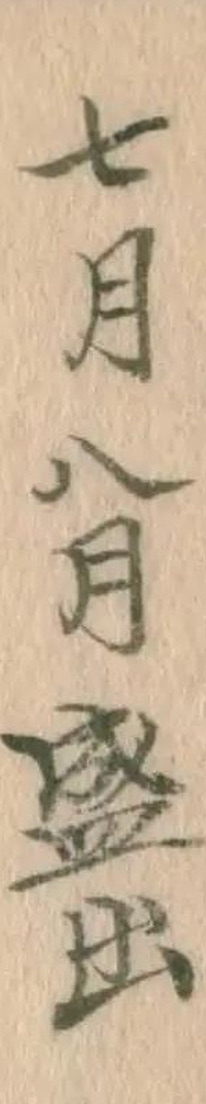七月八月盛出
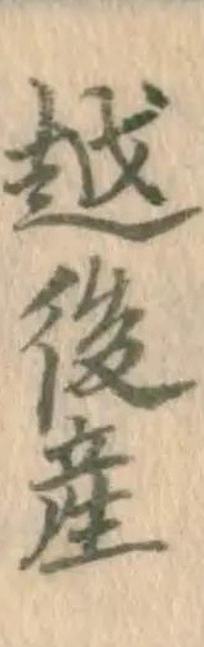越後産
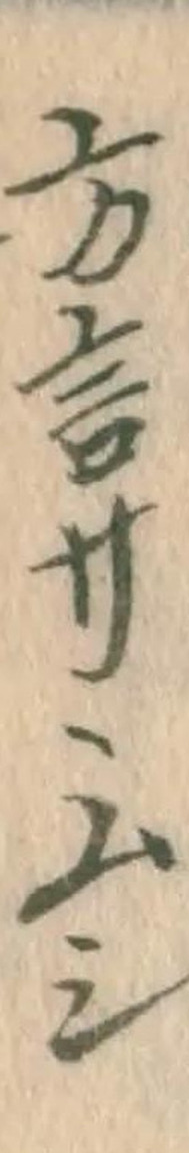方言サヽムシ

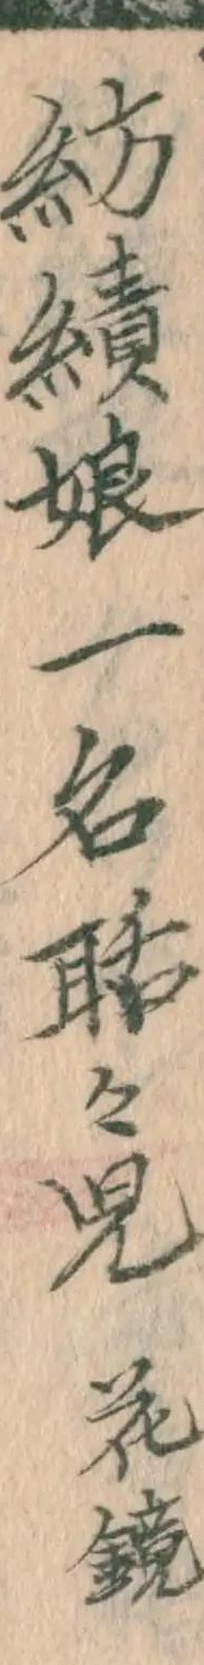紡績娘一名聒々児花鏡
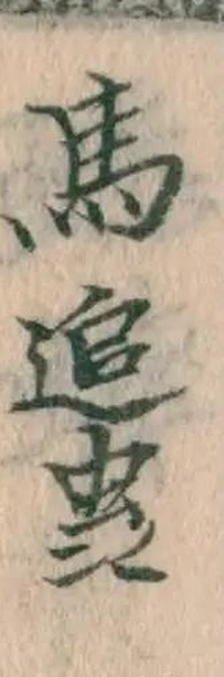馬追蟲
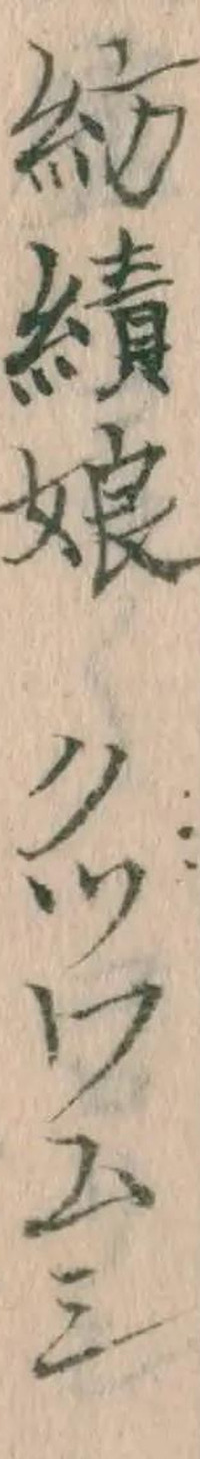紡績娘クツワムシ
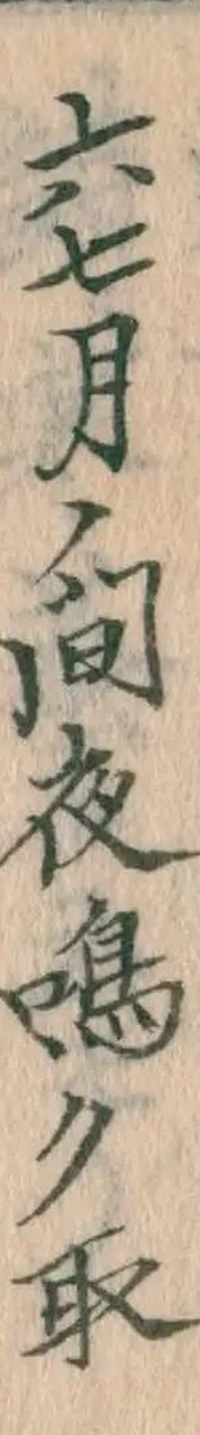六七月ノ間夜鳴ク取
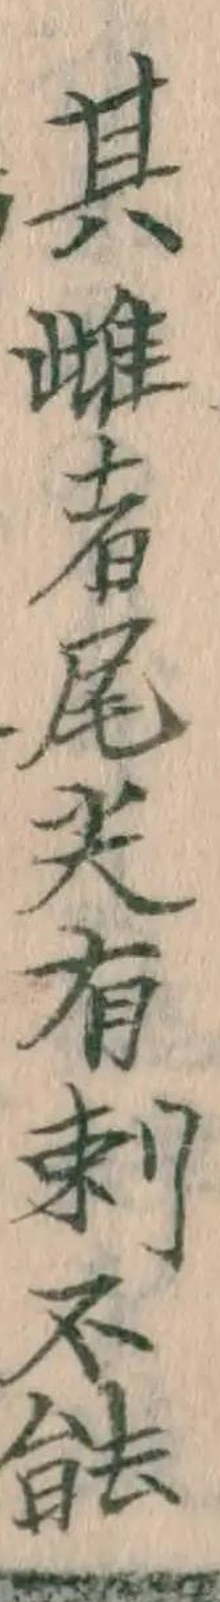其雌者尾尖有刺不能
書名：千蟲譜 3巻. [3]
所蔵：国立国会図書館 National Diet Library, JAPAN
